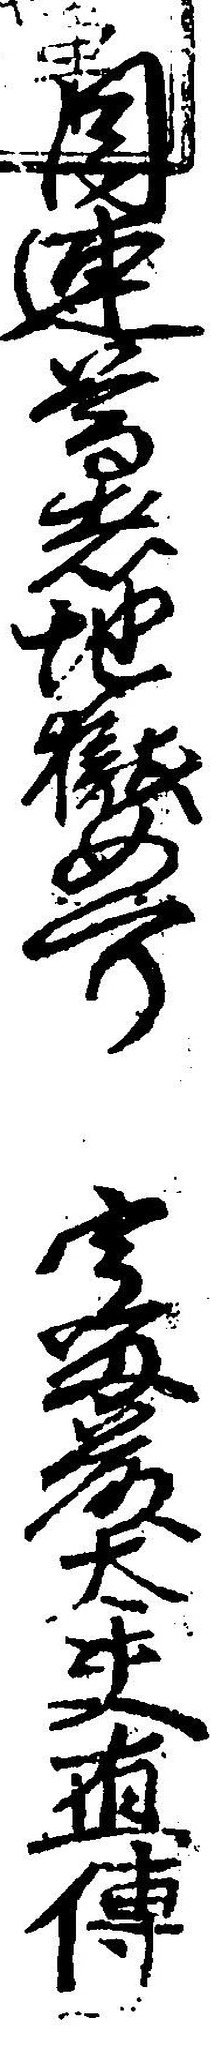目連尊者地獄めくり宇留藤太夫直伝
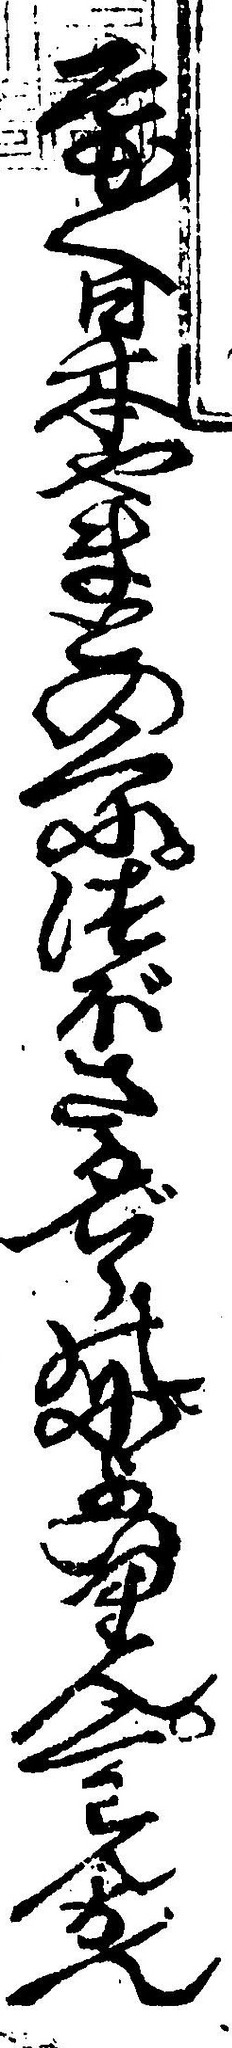そも〳〵日本やまとのくに。つぼさかでらのによいりん。くわんおん
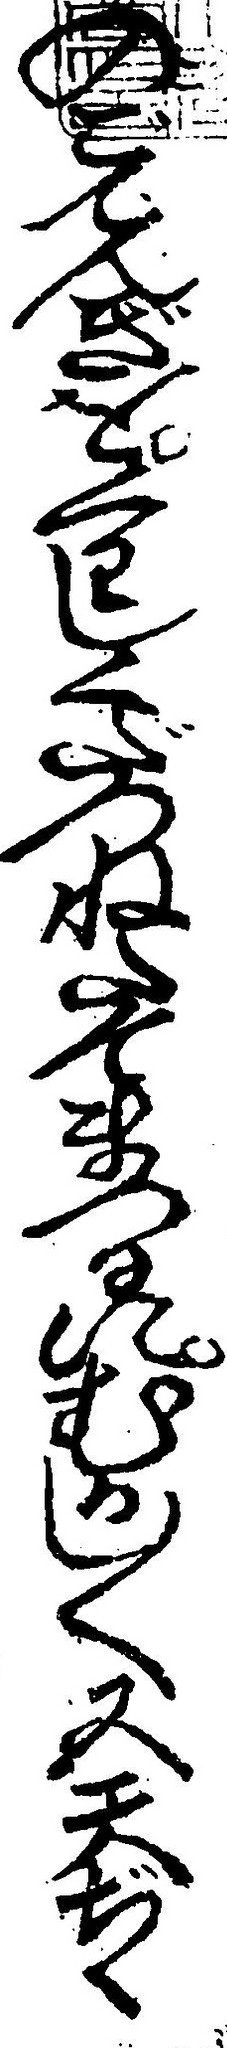のごてんぎを。くわしくたづねたてまつるに。むかし〳〵五天ぢく
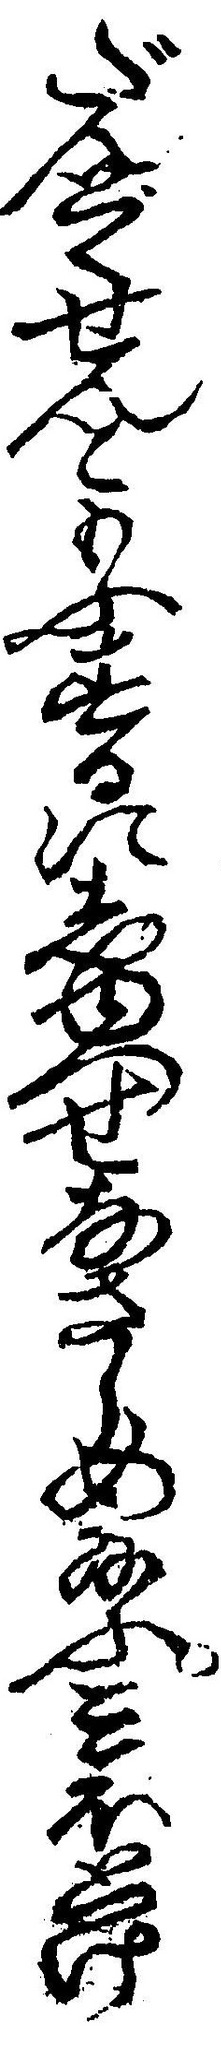だんとくせんともふするにしゆつせなさしめ給ふ。みほとけ
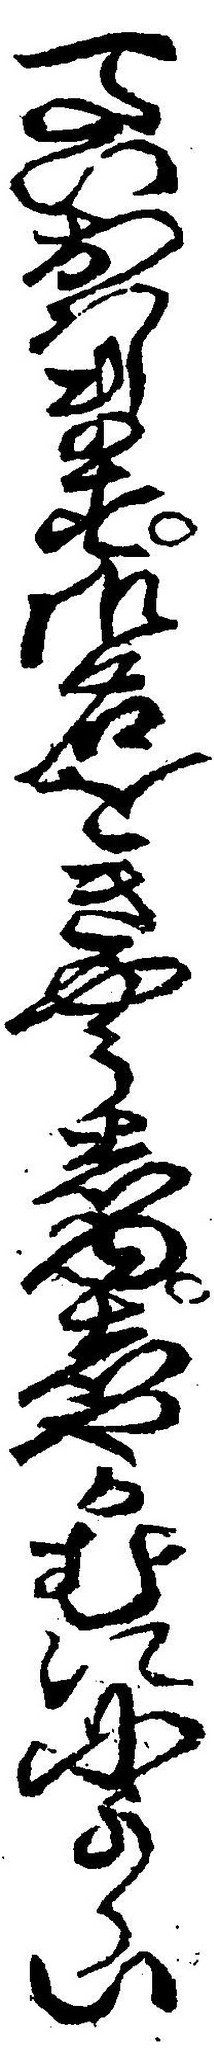一たいおはします。御名をきやうしゆ。しやかむにによらい
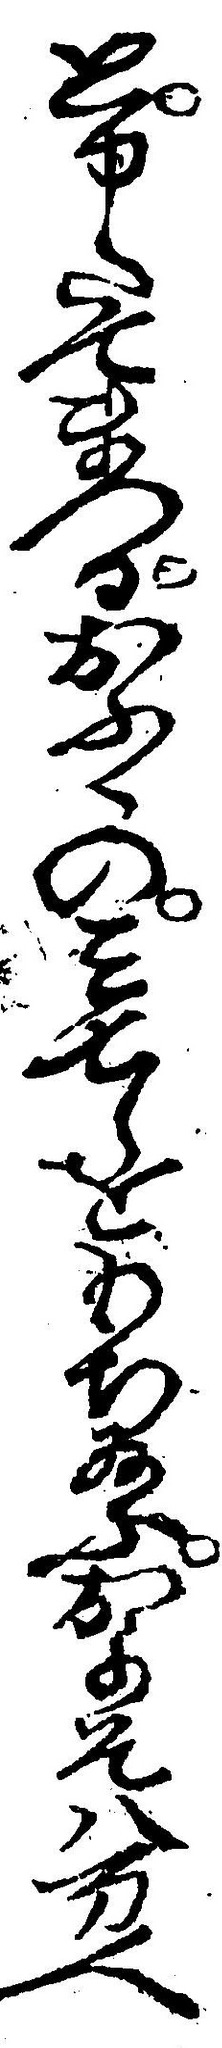と。申たてまつる。おふくの。みてらをもち給ふ。およそ八万人
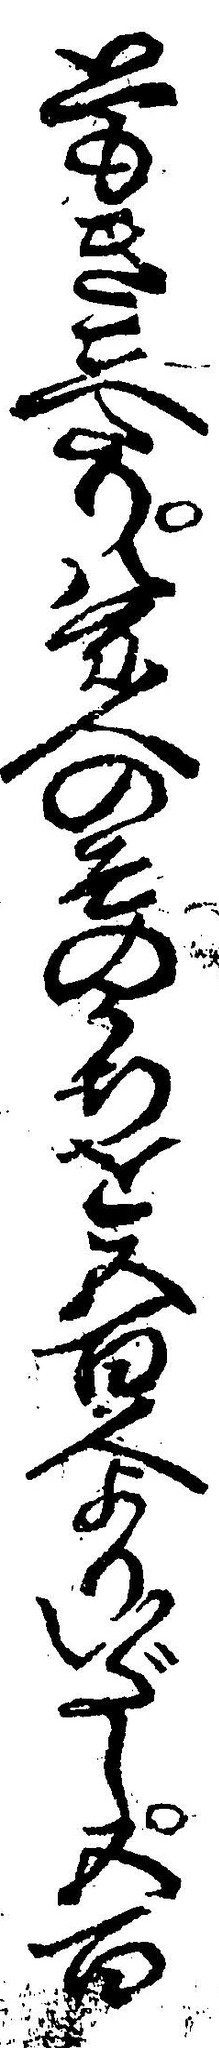ともきこへたり。八万人のそのうちを五百人よりいだし。五百
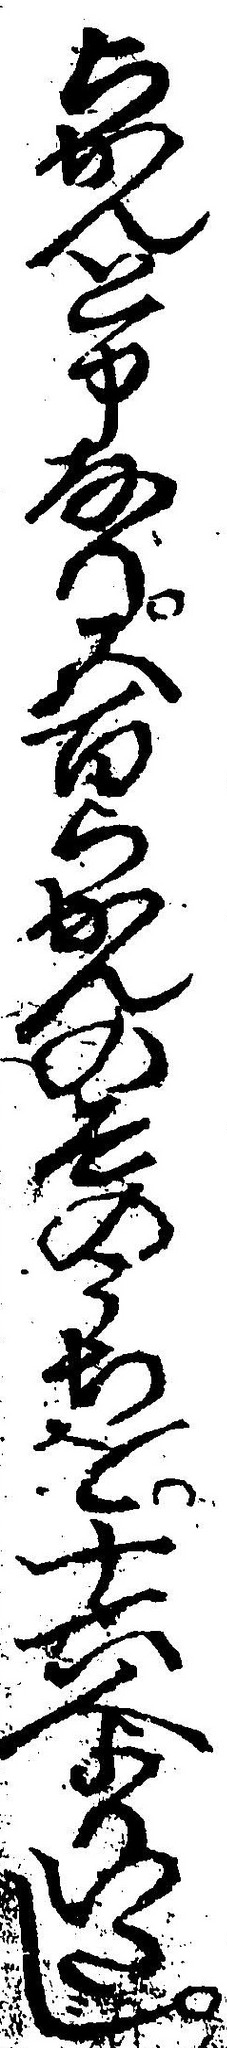らかんと申なり。五百らかんのそのうちを。十六人よりいだし。

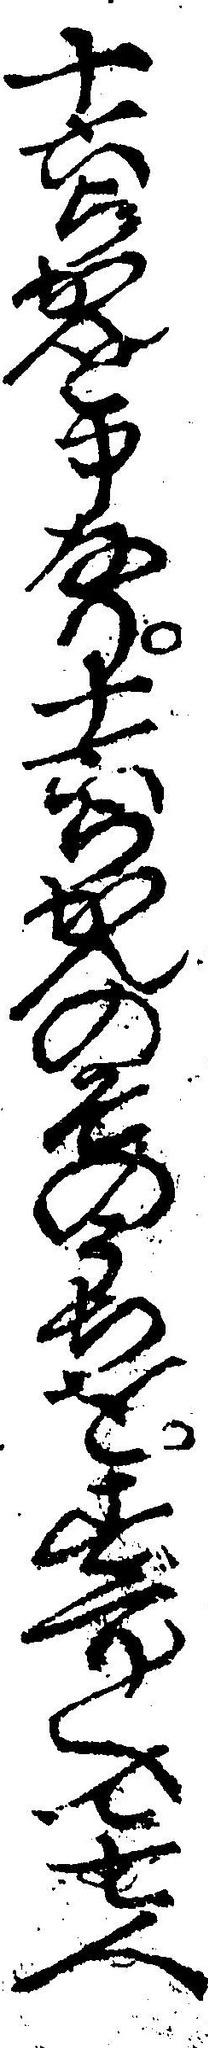十六らかんと申なり。十六らかんのそのうちを。すぐり〳〵て七人
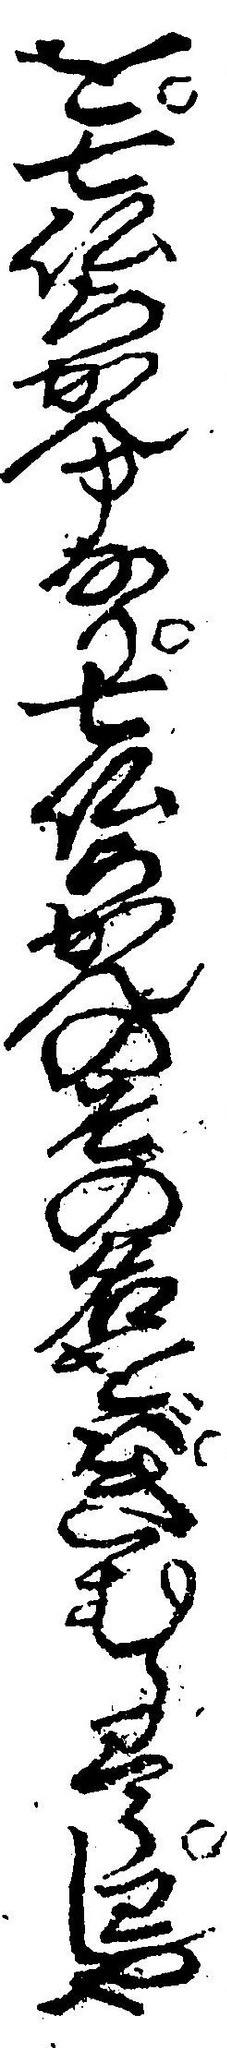を。七仏らかん申なり。七仏らかんのその名をば。きむらわう。わしやむら
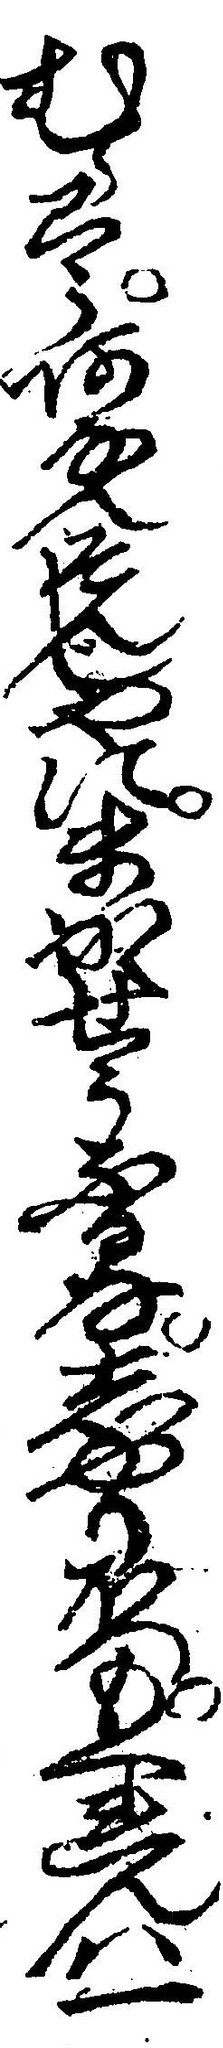わう。あなんそんじやに。まかせうふるな。しやりほつ。もくれんは一
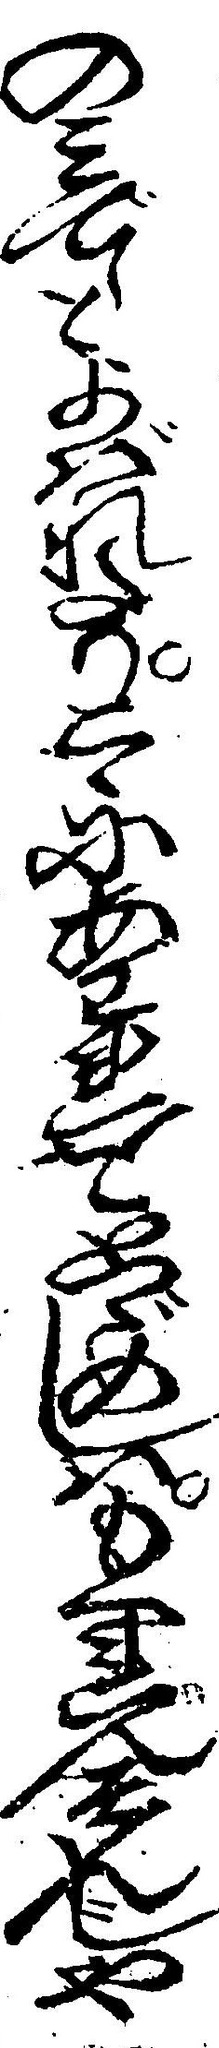のみでしとよばれたり。こゝにあわれをとゞめしは。もくれんそんじや
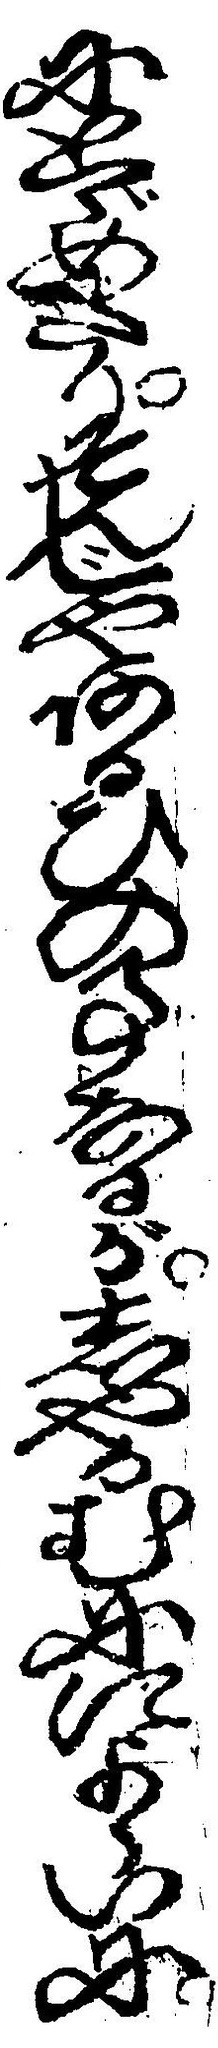にとゞめたり。そんじやあるひの事なるが。しやかむにによらいに。
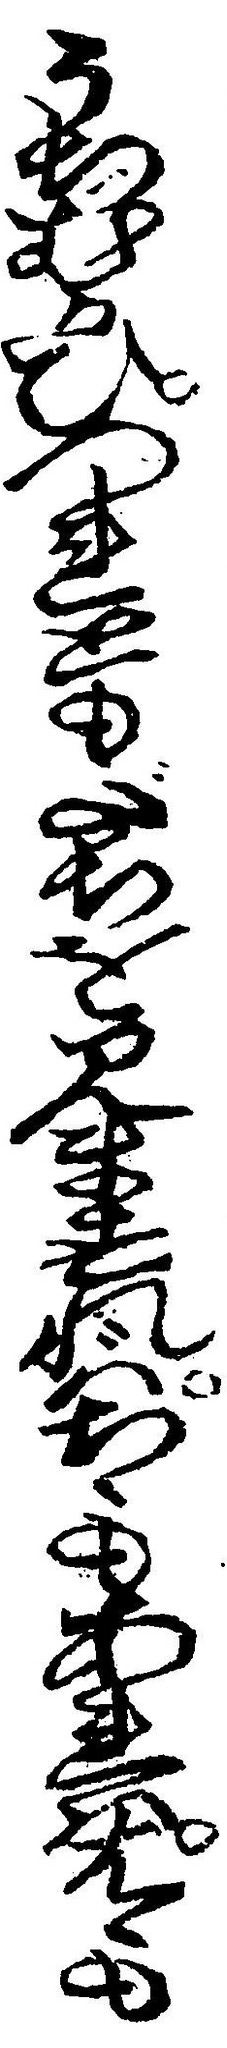うちむかひ。つれともだちを見ますれば。ちゝもあれは。はゝも
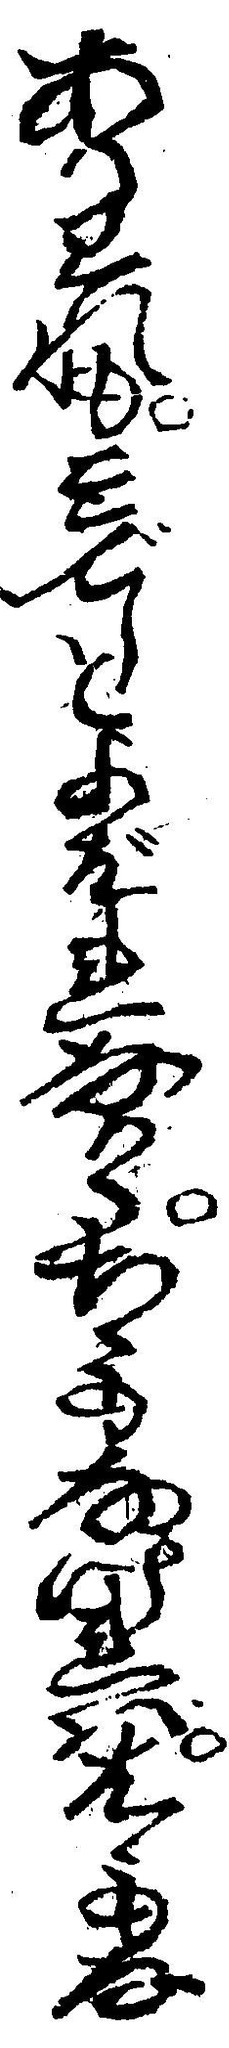ありわれも。をでしとよばれなから。ちゝもなけれは。はゝもな
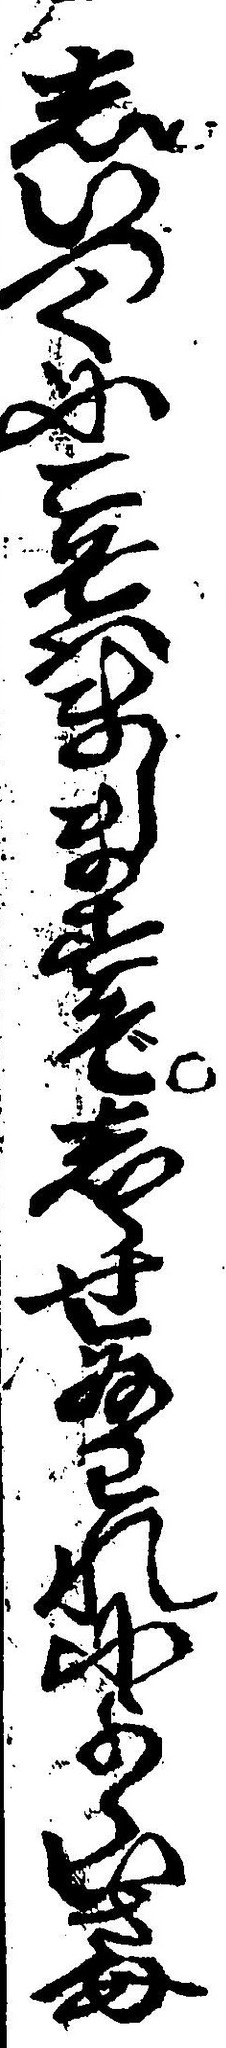し。いつくにこそはましますぞ。しらせ給われによらいさま
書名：目連尊者地獄めくり / 宇留藤太夫正本
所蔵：東京大学総合図書館 General Library in the University of Tokyo, JAPAN
